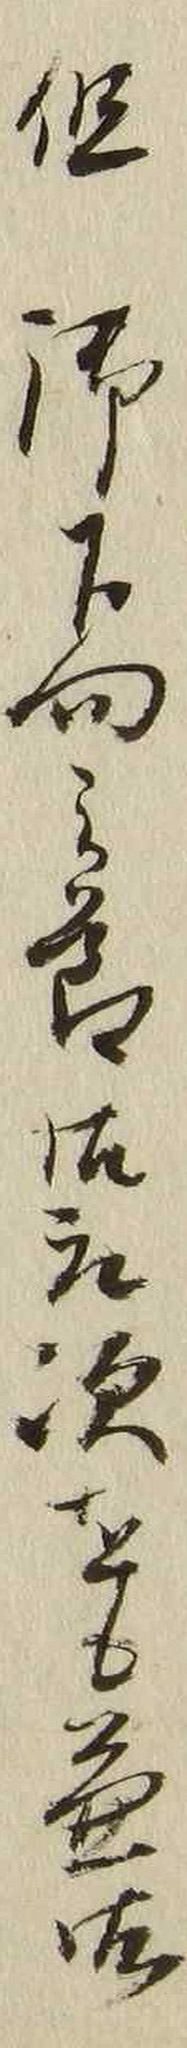但御下向之節御取次をも兼御
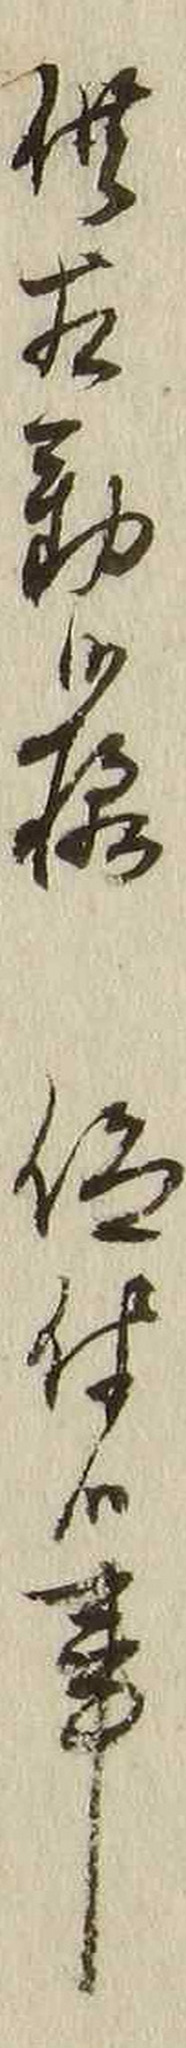供相勤候様仰付候事
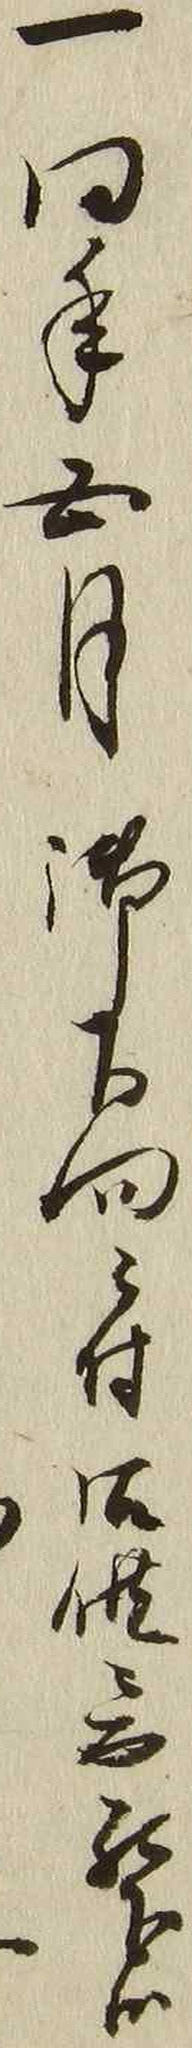一同年五月御下向ニ付御供ニ而罷下候
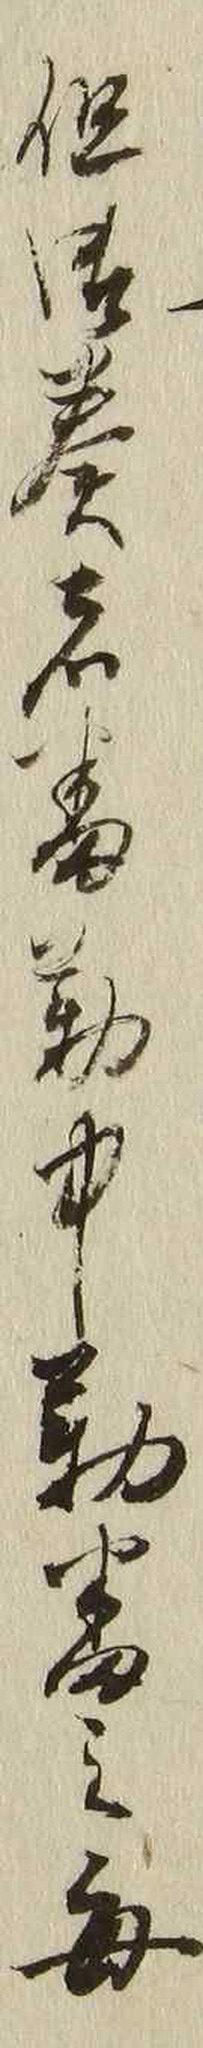但御奏者番勤中勤番之毎
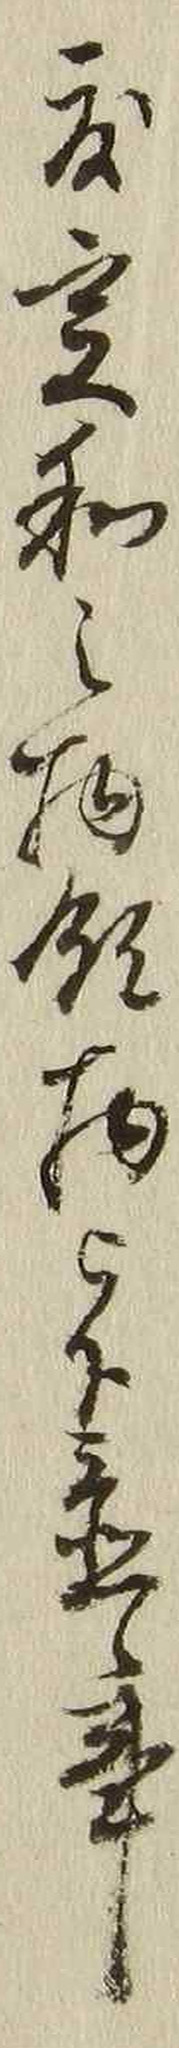度定和之拝領物被下置候事
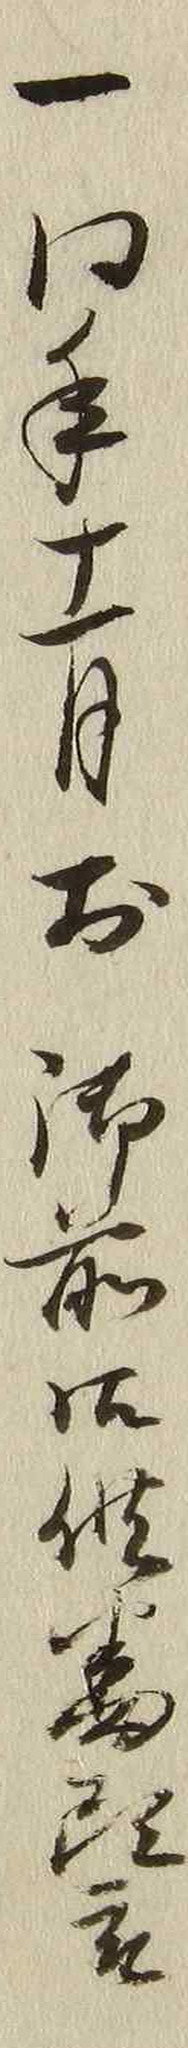一同年十一月於御前御供番頭被
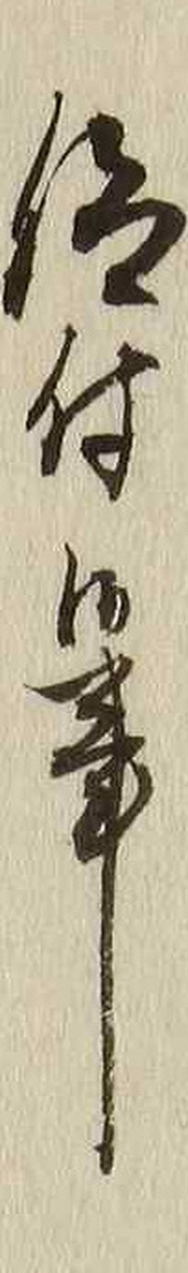仰付候事
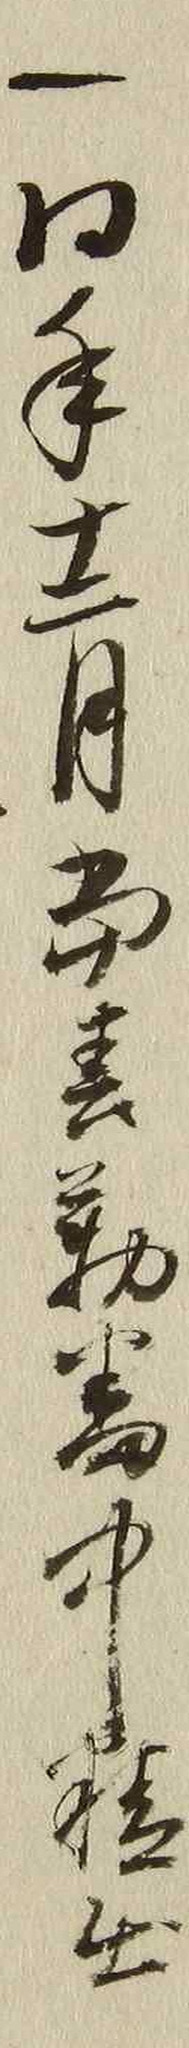一同年十二月当春勤番中精出
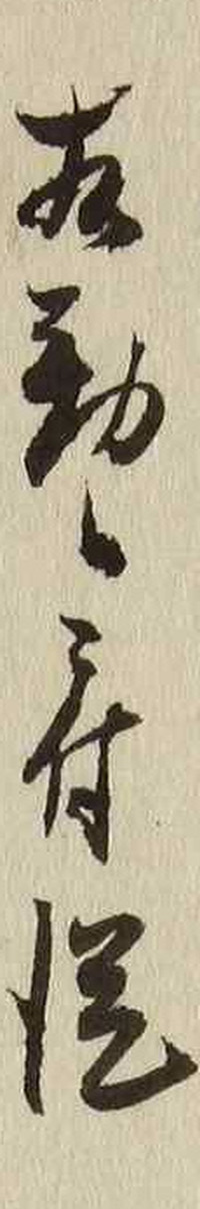相勤候ニ付従
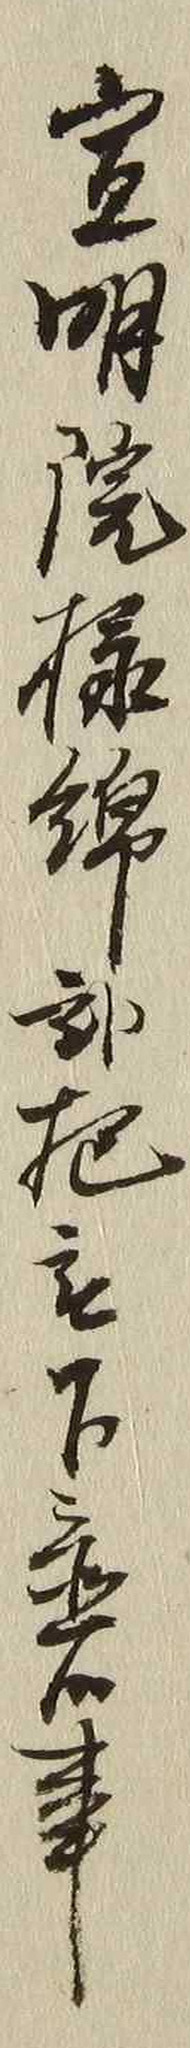宣明院様綿弐把被下置候事
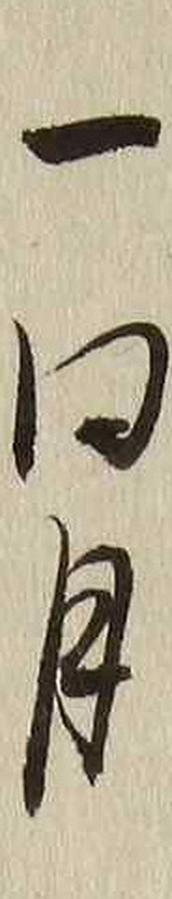一同月
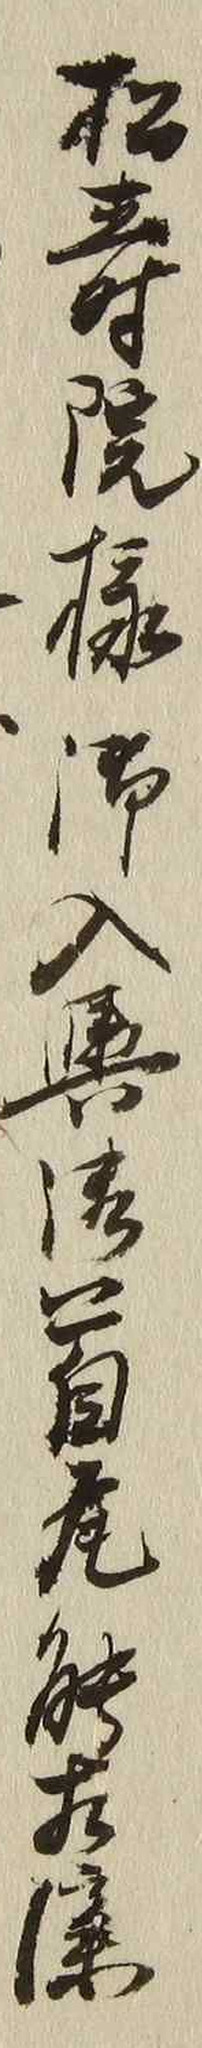松寿院様御入輿御首尾能相済
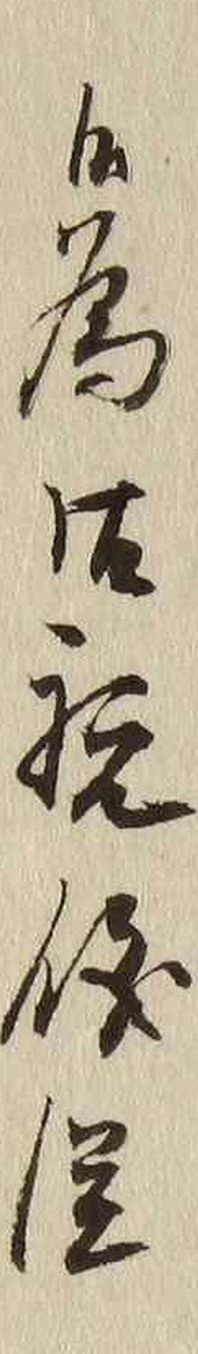候為御祝儀従
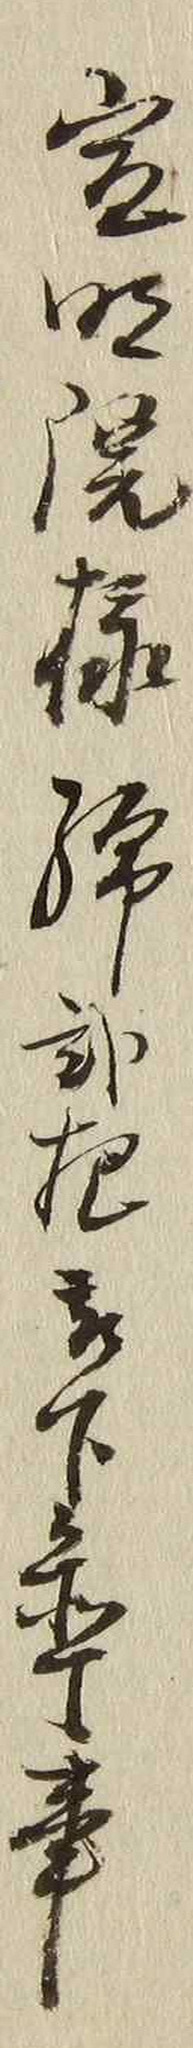宣明院様綿弐把被下置候事
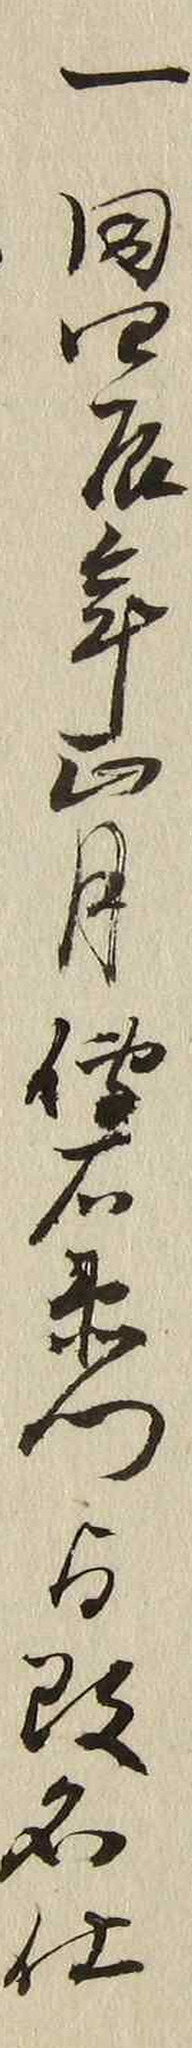一同四辰年正月伝右衛門与改名仕
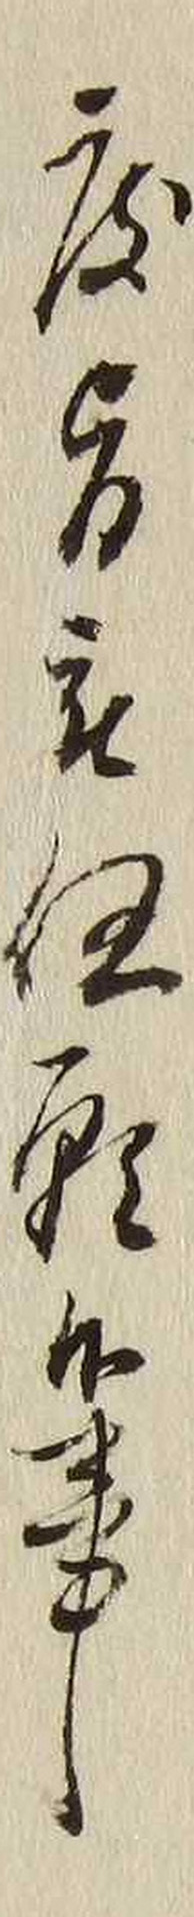度旨被任願候事
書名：諸士系譜　巻之348　も之部4
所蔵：会津若松市立会津図書館
